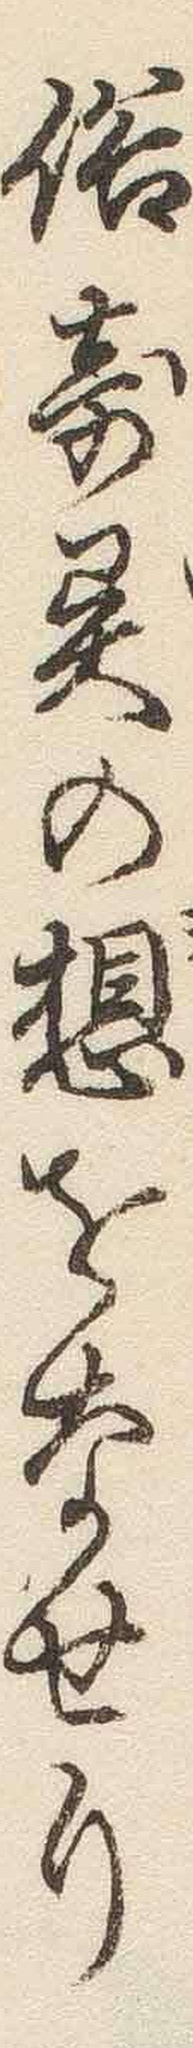俗竒異の想をなせり
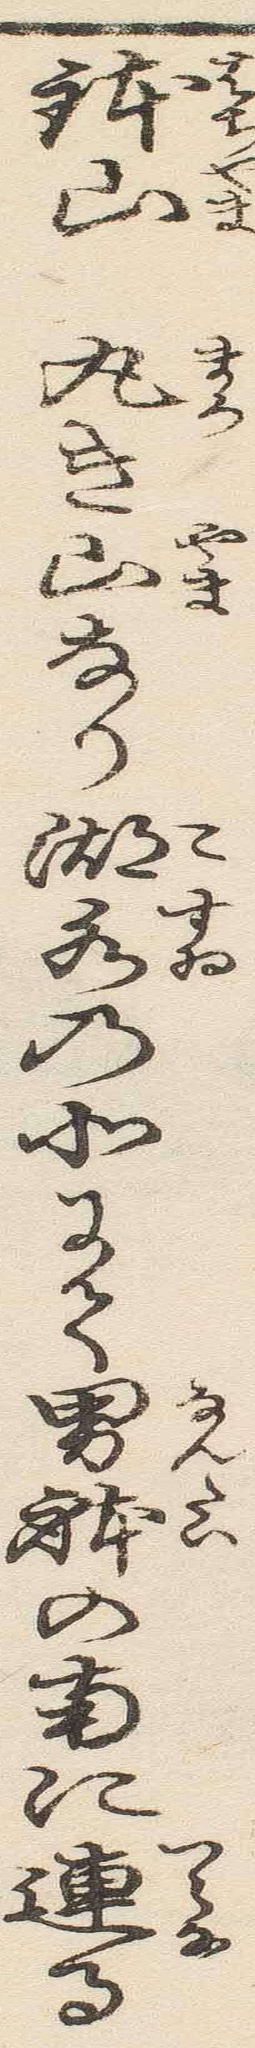鉢山丸き山なり湖水の北にて男躰の南に連る
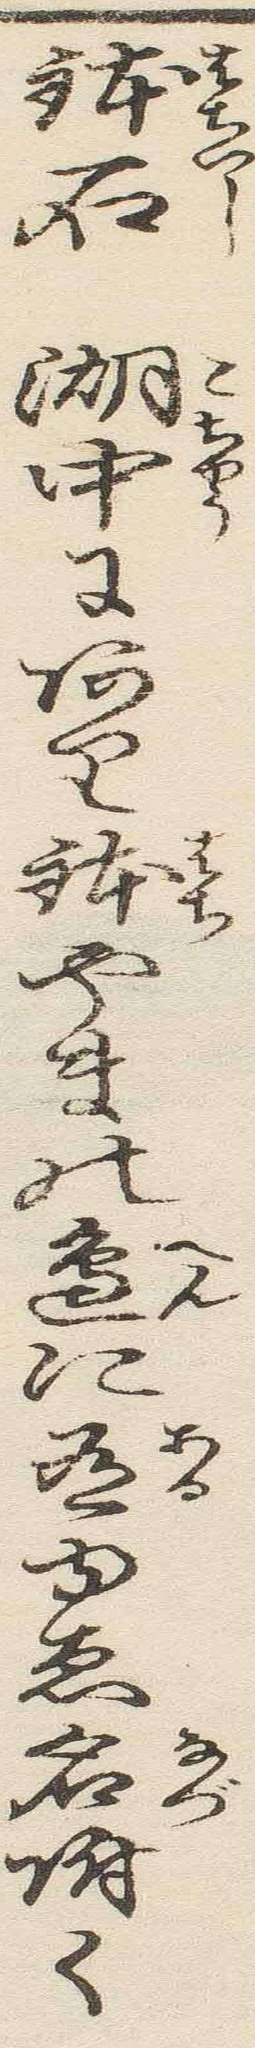鉢石湖中にあり鉢やまの邊に有ゆゑ名附く
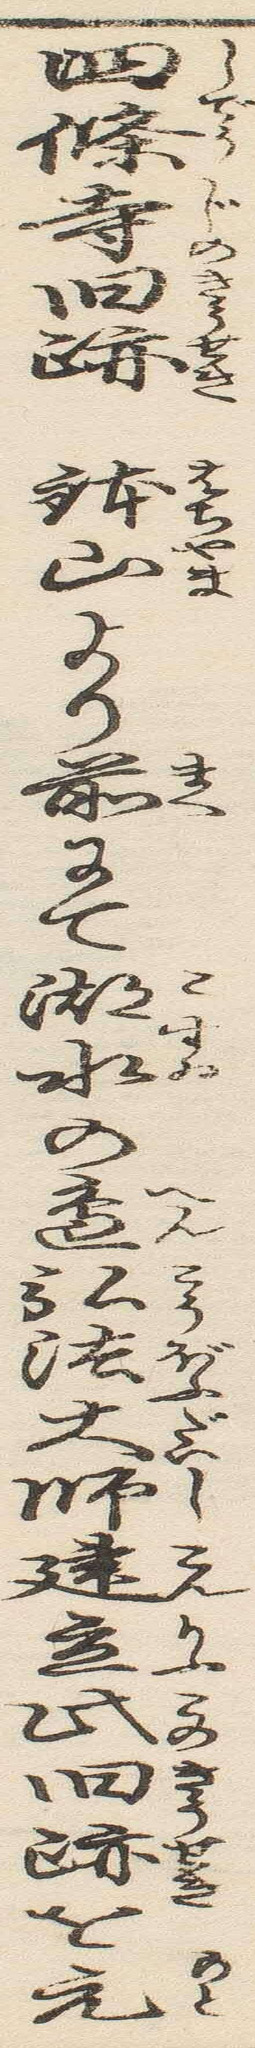四條寺旧跡鉢山より前にて湖水の邊弘法大師建立此旧跡を元
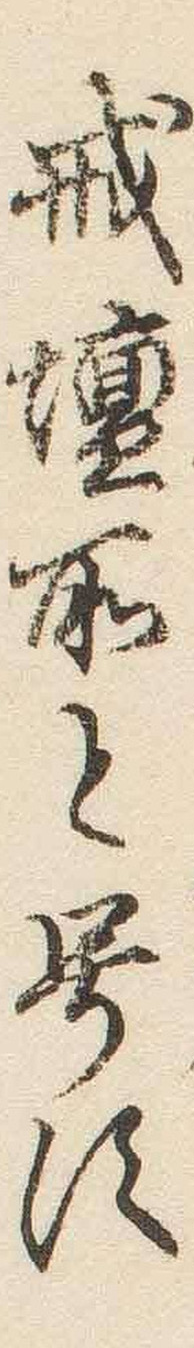戒壇所と号す
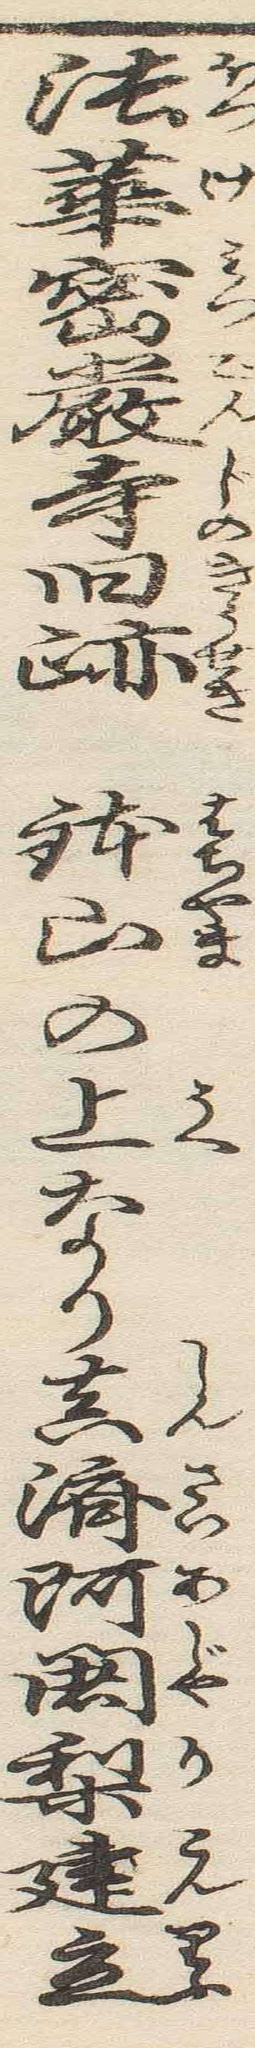法蕐密嚴寺旧跡鉢山の上なり真済阿闍梨建立
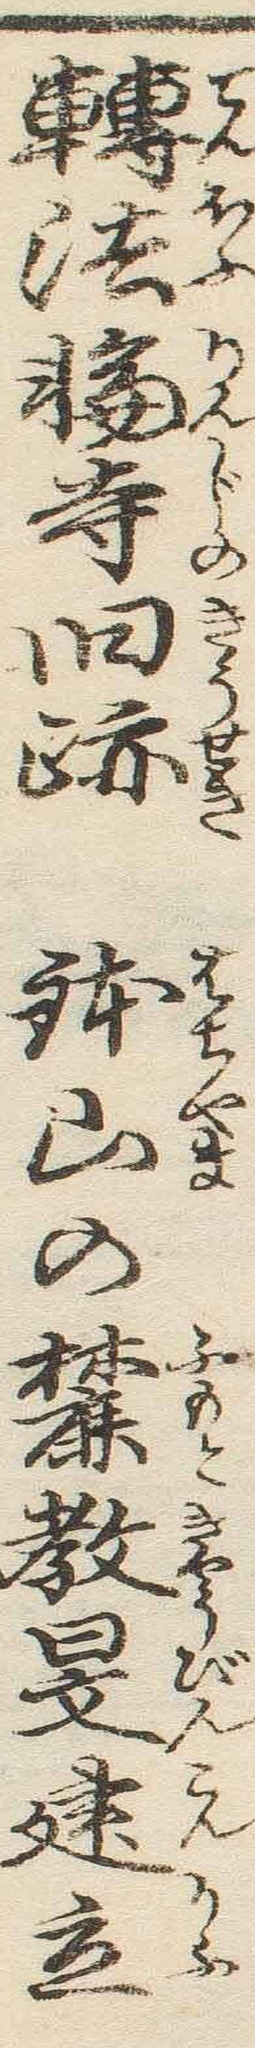轉法輪寺旧跡鉢山の麓教旻建立
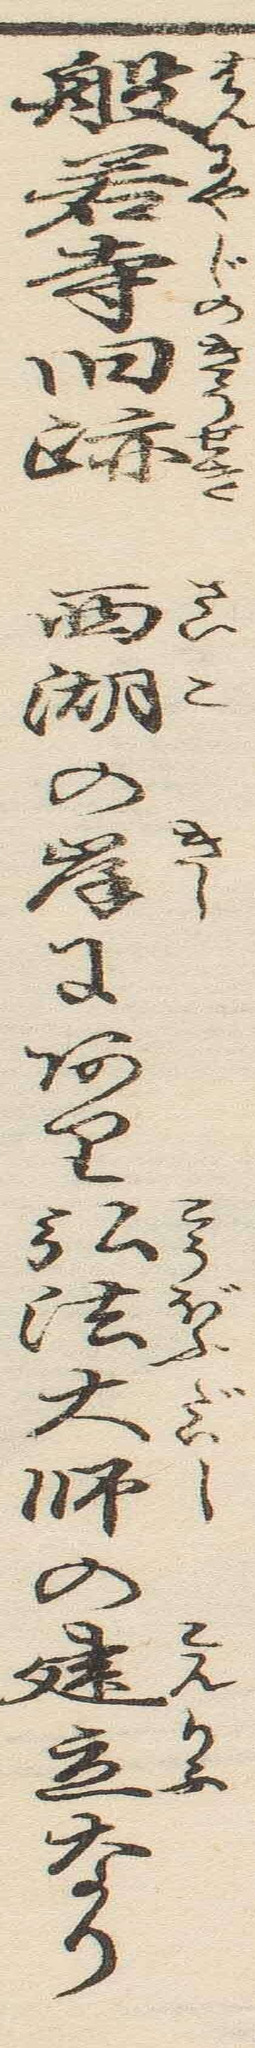般若寺旧跡西湖の岸にあり弘法大師の建立なり
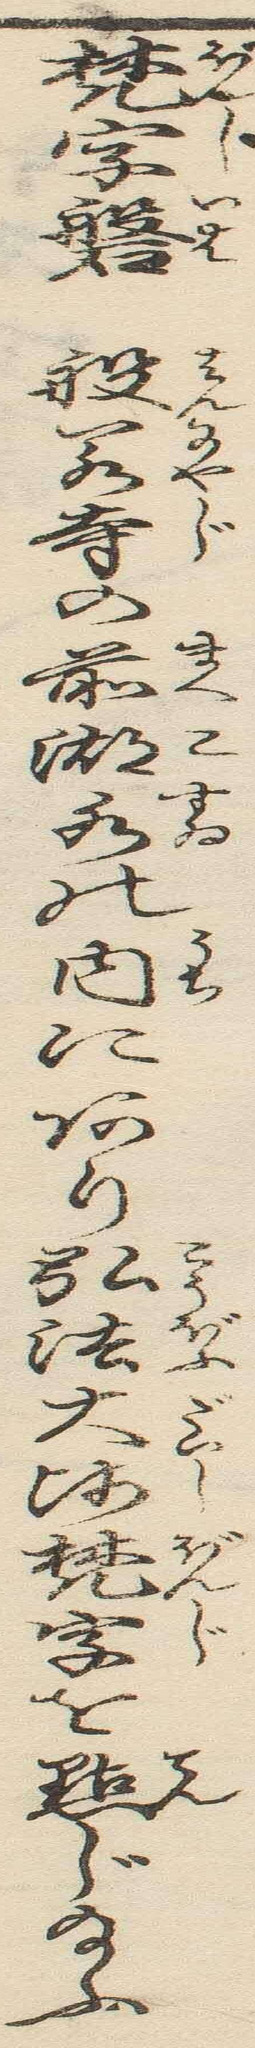梵字磐般若寺の前湖水の内にあり弘法大師梵字を㸃じ給ふ
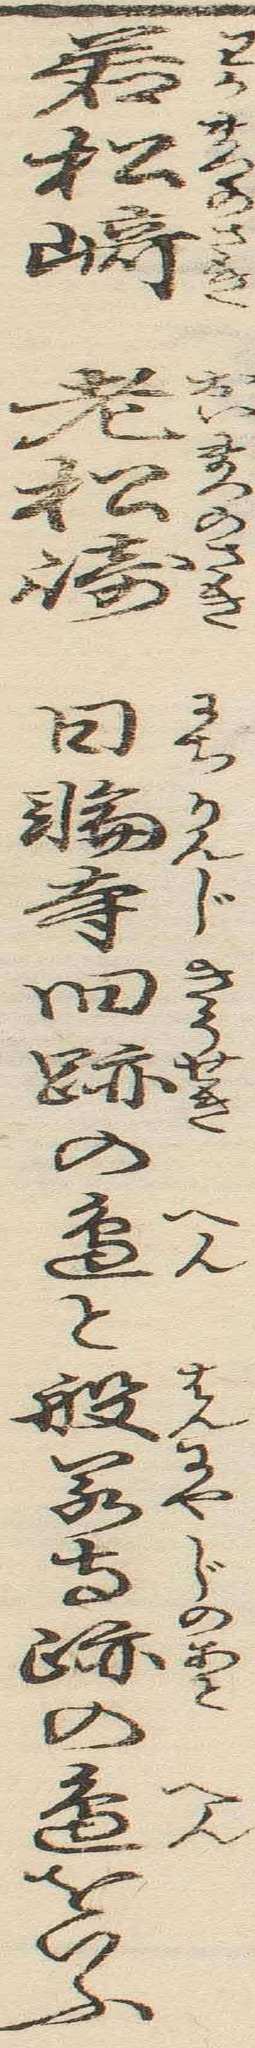若松﨑老松﨑日輪寺旧跡の邊と般若寺跡の邊をいふ
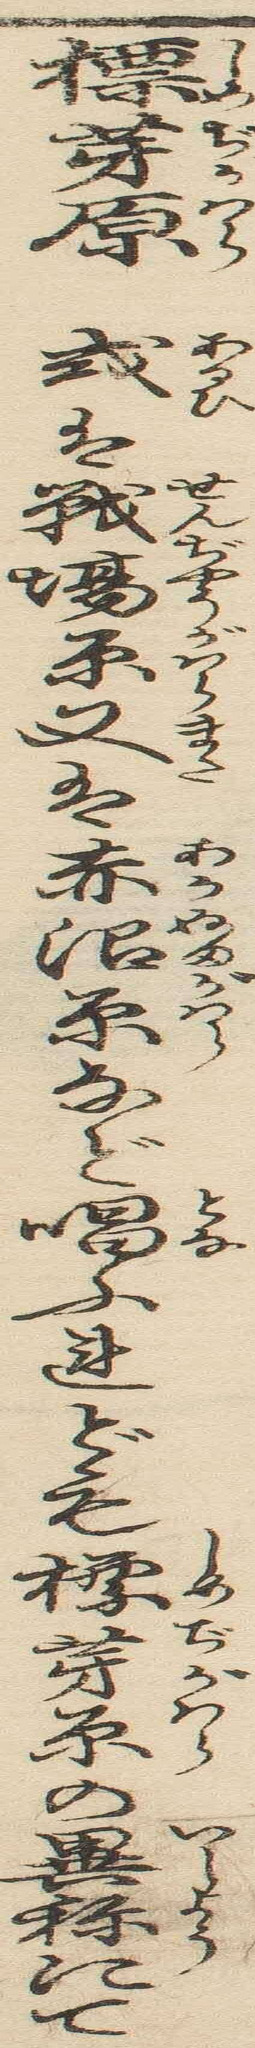標芽原或は戦塲原又は赤沼原など唱ふれども標芽原の異称にて

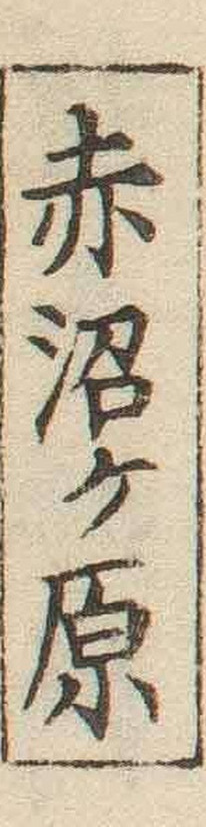赤沼ヶ原

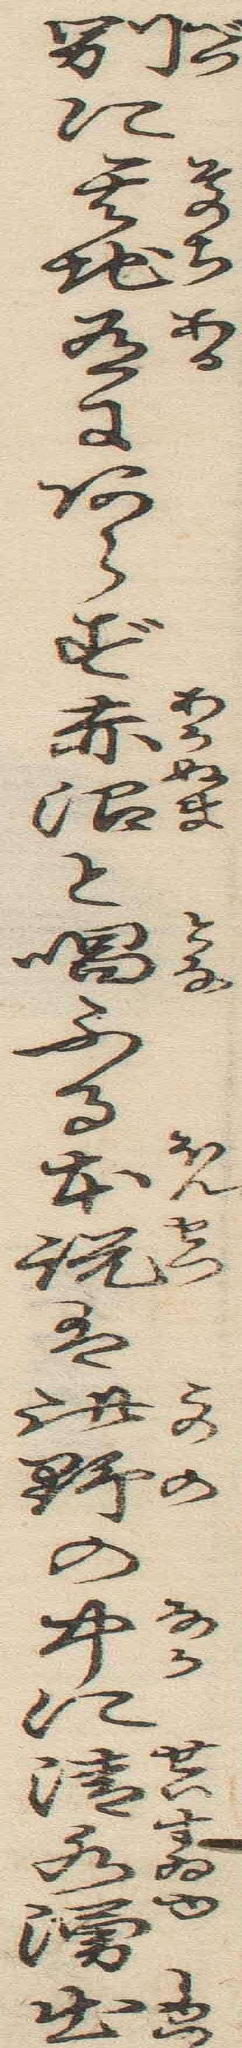別に其地有にあらず赤沼と唱ふる本説は此野の中に清水湧出
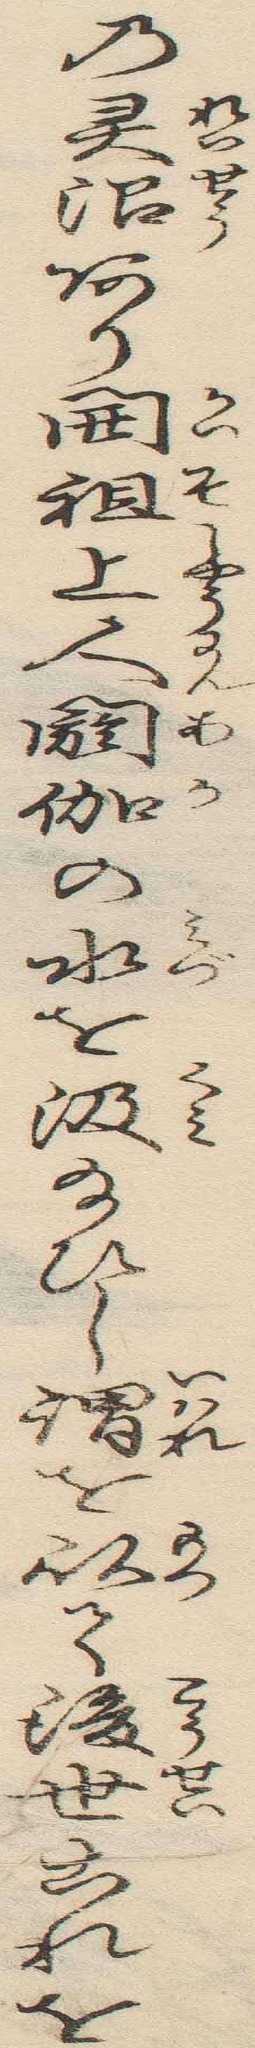の㚑沼あり開祖上人閼伽の水を汲給ひし謂を以て後世これを
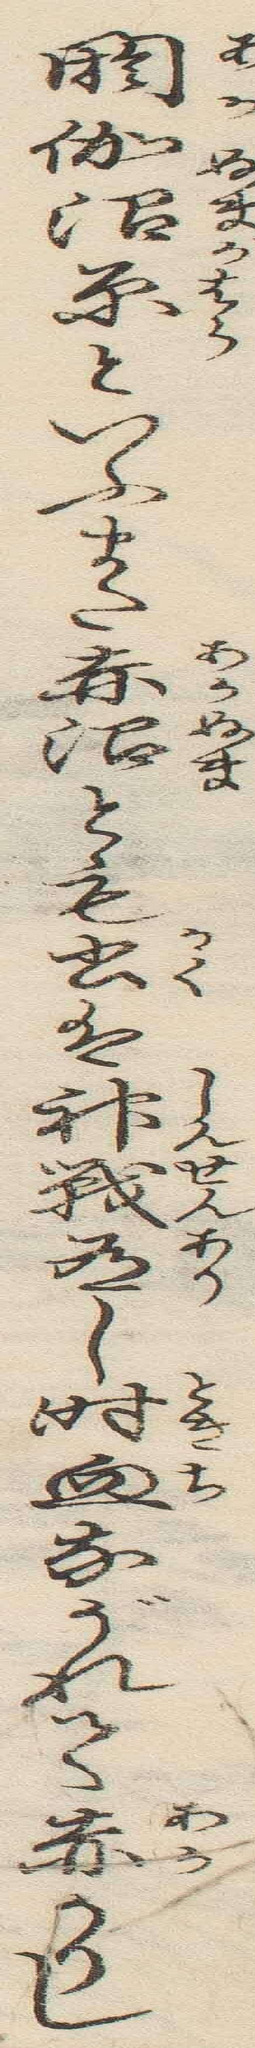閼伽沼原といふまた赤沼とも書は神戦有し时血ながれて赤かりし
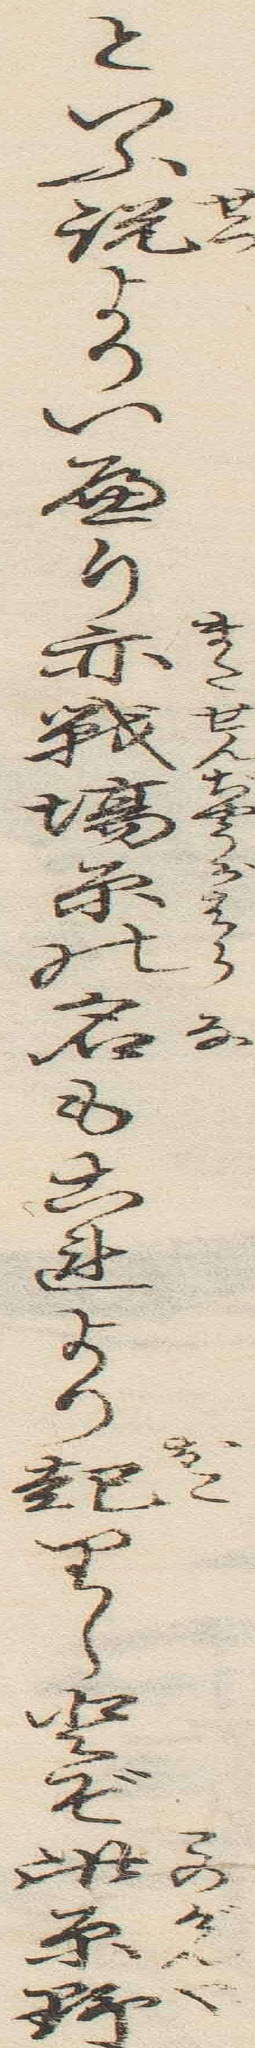といふ説よりいへり亦戦塲原の名もこれより起りしとぞ此原野
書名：日光山志
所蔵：東京学芸大学附属図書館 国文学研究資料館
